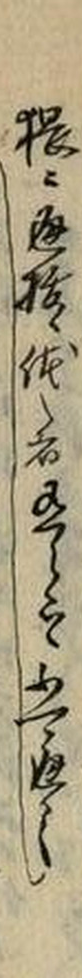猥ニ通抜候体之者有之候ハヽ不可通之
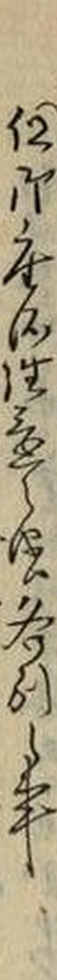但御座所往還之儀ハ各別之事
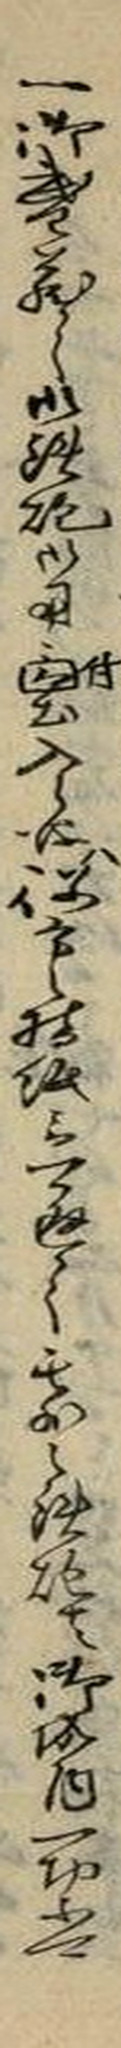一御武具蔵之御鉄砲御用ニ付出入之儀ハ役方指紙ニ而可通之其外之鉄砲者御城内一切不可
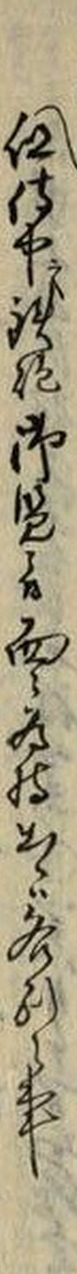但侍中ニハ鉄砲御覧ニ付面々為持出候ハ格別之事
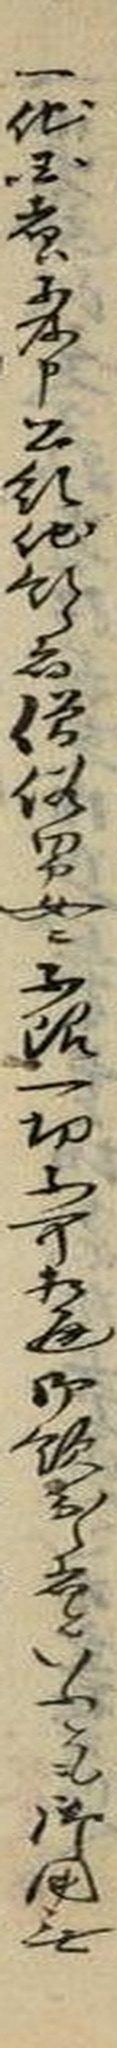一他国者ハ不及申公領他領之者僧俗男女ニ不限一切不可相通御領分之者といふとも御用無
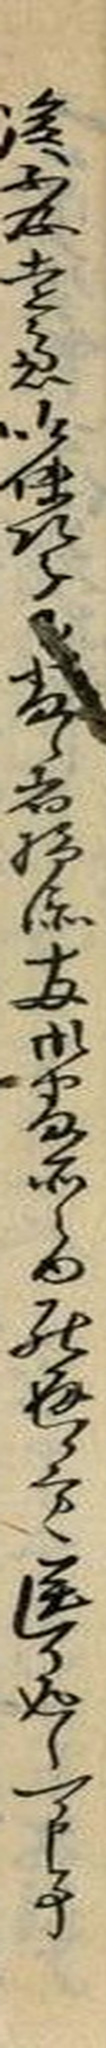後へ不及遠慮吟味次之当番之者指添両御番所之内罷通候方へ送り返し可申候事
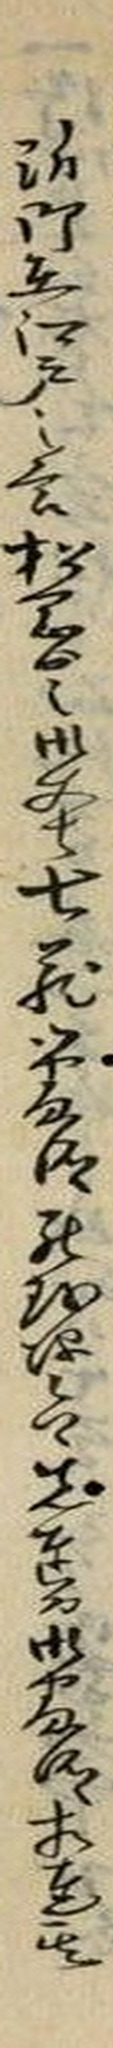附御在江戸之節松岡之御使者七蔵御番所へ罷越儀ニ候ハヽ先達而御番所へ相達其
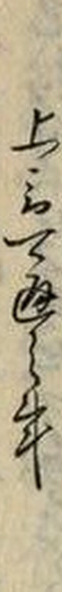上ニ而可通之事
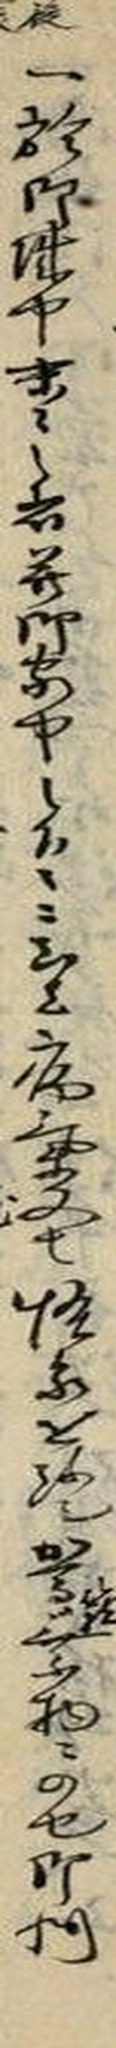一於御城中末々之者并御家中之下々ニ至迄病気又ハ怪我を致シ駕籠乗物ニのセ御門
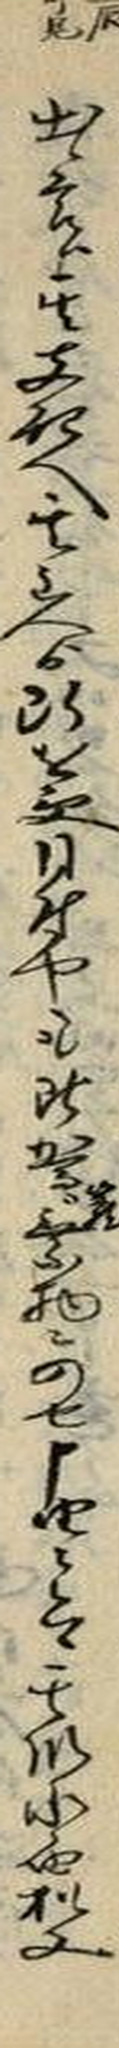出候節ハ其支配人其主人ゟ断を受目付中へも断駕籠乗物ニのせ申由ニ候ハヽ其段承届猶又
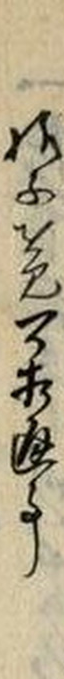様子を見可相通候事
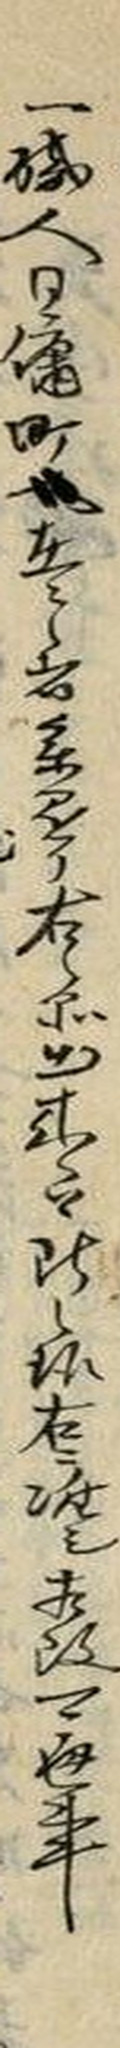一職人日雇町在々之者参懸り右之品出来候ハヽ断之趣右ニ准シ相改可通事
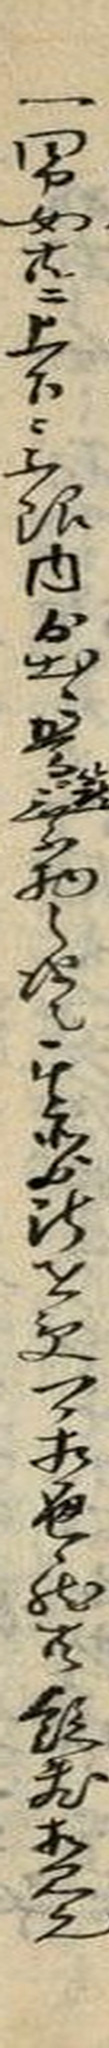一男女共ニ上下ニ不限内ゟ出候駕籠乗物之儀は其所ゟ断を受可相通候然共紛敷相見え
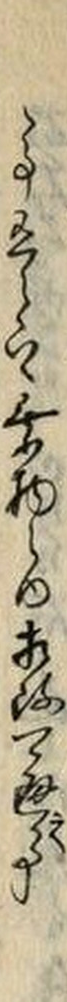候事有之候ハヽ乗物之内相改可通之事
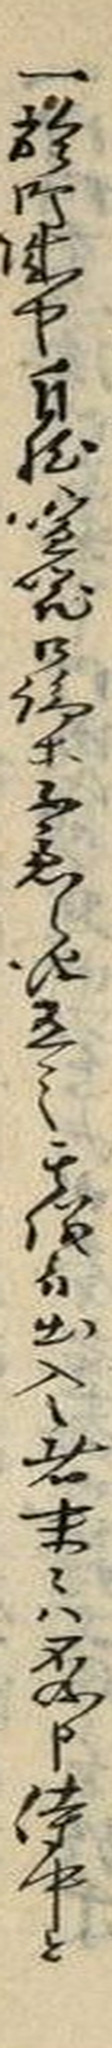一於御城中自然喧嘩口論等不慮之儀有之其儀ニ付出入之者末々ハ不及申侍中と
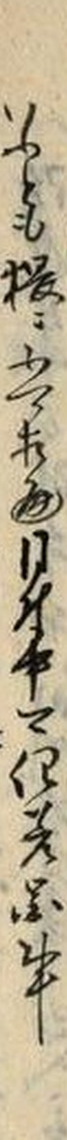いふとも猥ニ不可相通目付中可任差図事
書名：御門御櫓之部
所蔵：福井県文書館 Fukui Prefectural Archives
